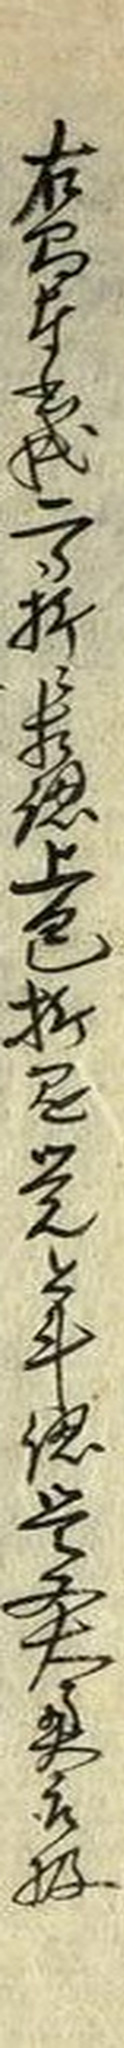右間奉書紙二ツ折ニ相認上包折懸覚と斗認是又大奥取扱
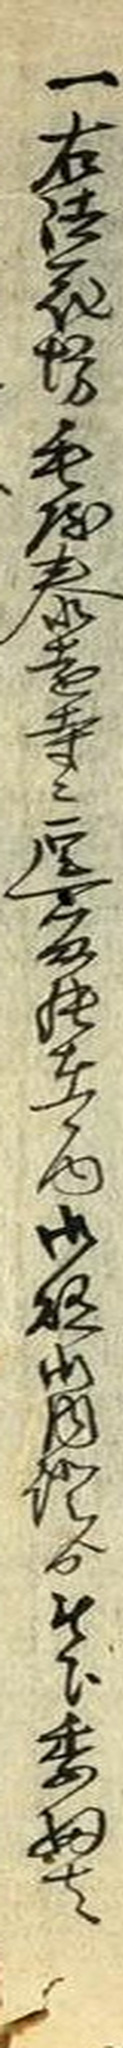一右法蔵坊毛屋泰遠寺ニ逗留罷在候内御賄御内証ゟ被下委細者
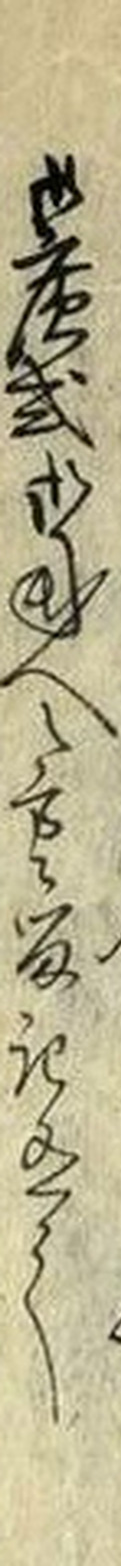御広式御用人之方ニ留記有之
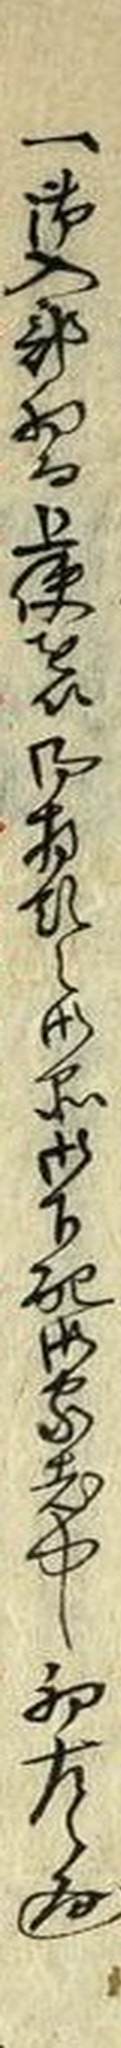一御入部初而上使を以御拝領之御品御下配御家老中初左之通
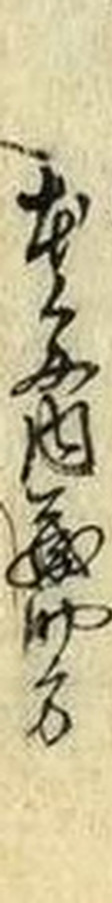本多内蔵助方
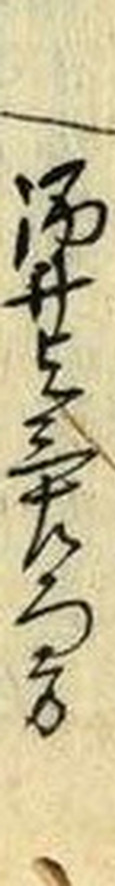酒井与三左衛門方
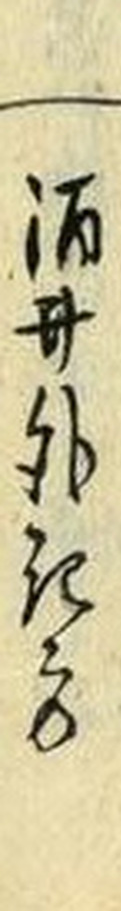酒井外記方
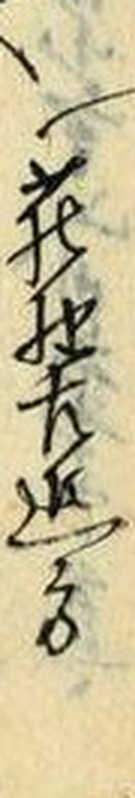荻野左近方
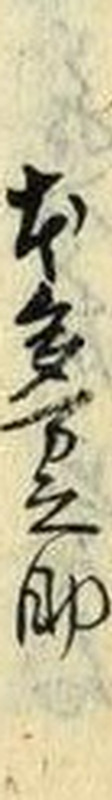同同本多万之助
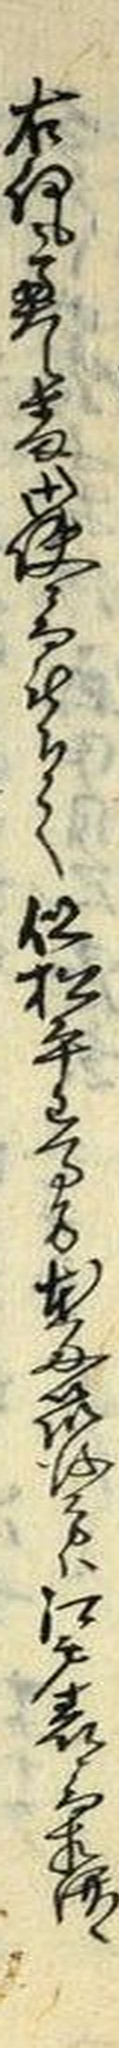右何も奥之番御使ニ而被下之但松平主馬方本多筑後方ハ江戸表ニ而相済候
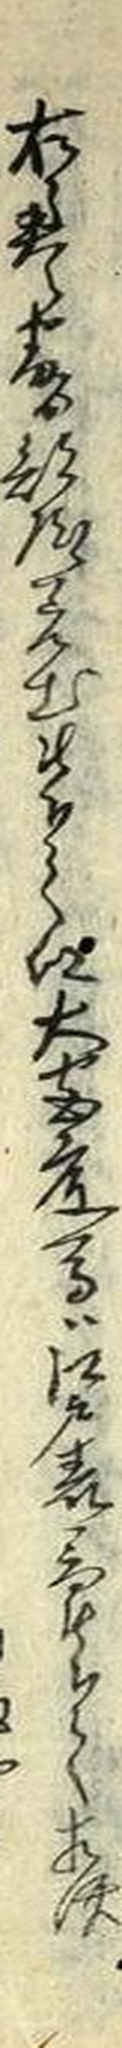右奥之番ゟ部屋へ差出被下之但大宮藤馬ハ江戸表ニ而被下之相済
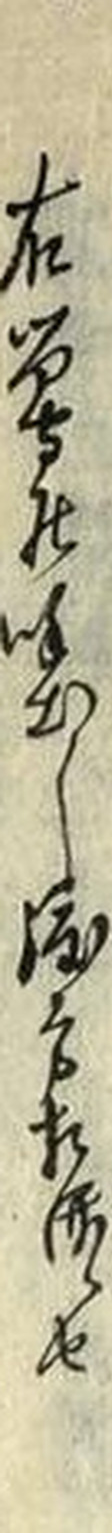右留守居呼出し渡方相済候由
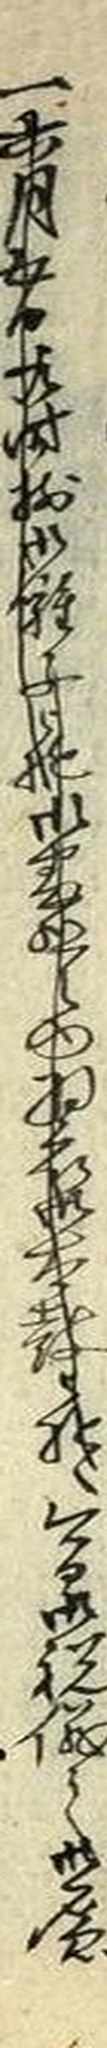一六月五日九時揃御囃子被遊御番組之内羽衣御太鼓被遊候今日御祝儀之御廉
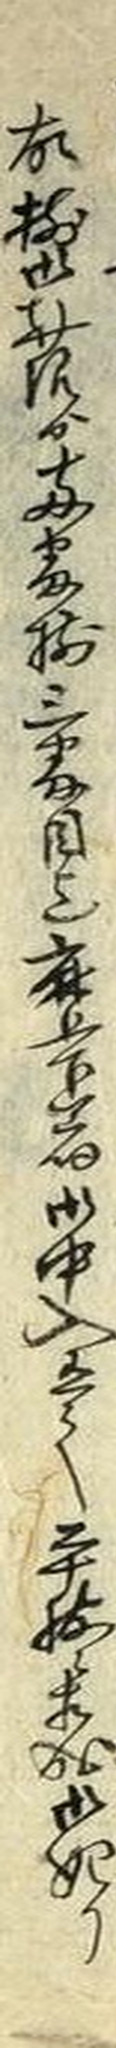故揃御刻限ゟ両番揃三番目迄麻上下着御中入有之平服ニ相成御始り
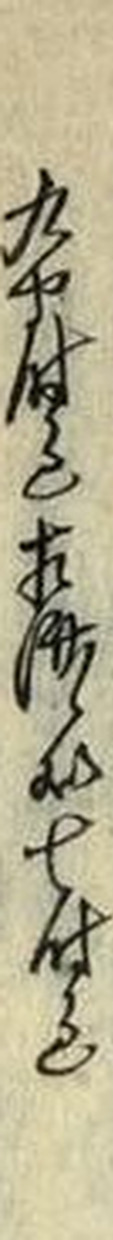九半時過相済候処七時過
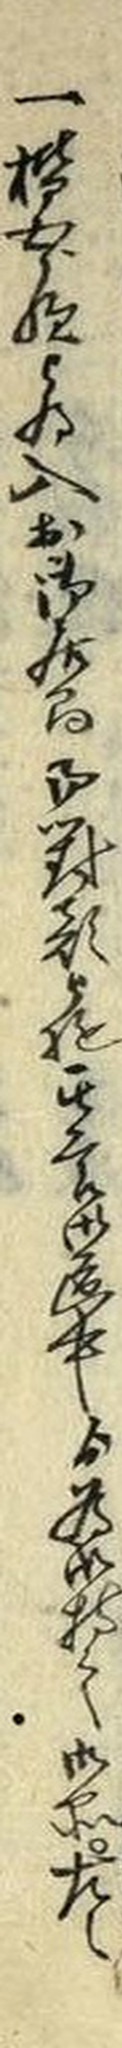一楷五郎様被為入於御居間御対顔被遊其節御道中ゟ為御持之御品并外御品共左之
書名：少傅日録抄（斉善付側向頭取日記、江戸并道中、初入在国、逝去後…
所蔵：福井県文書館 Fukui Prefectural Archives
